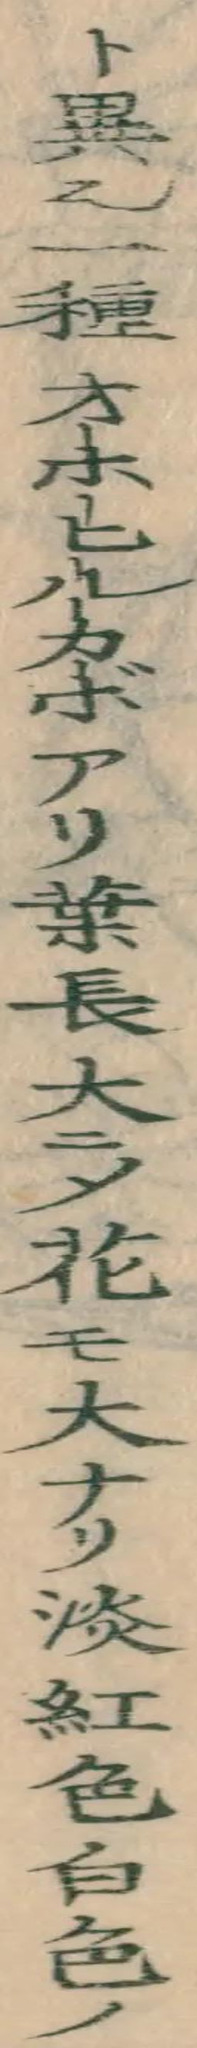ト異也一種オ-ホ-ヒ-ル-カ-ボアリ葉長大ニシテ花モ大ナリ淡紅色白色ノ
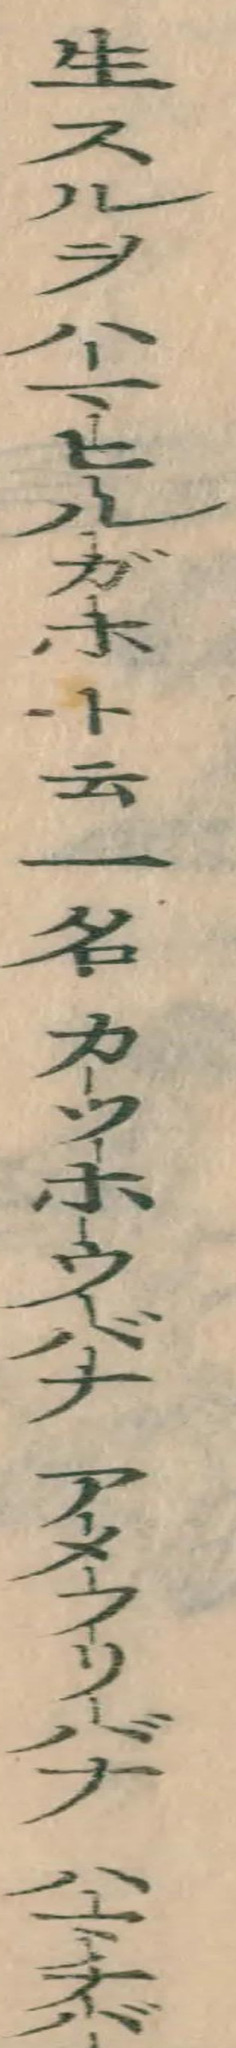生スルヲハ-マ-ヒ-ル-ガ-ホト云一名カ-ツ-ホ-ウ-バ-ナア-メ-フ-リ-バナハ-マ-チ-バ-
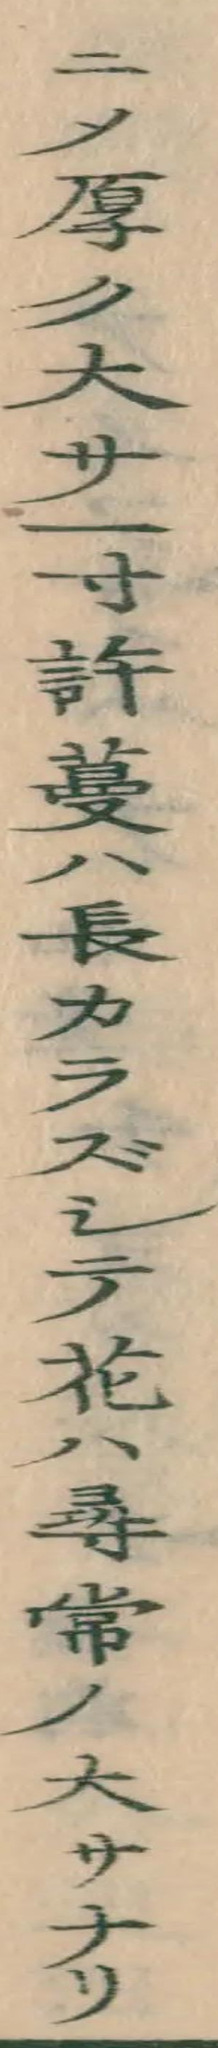ニシテ厚ク大サ一寸許蔓ハ長カラズシテ花ハ尋常ノ大サナリ
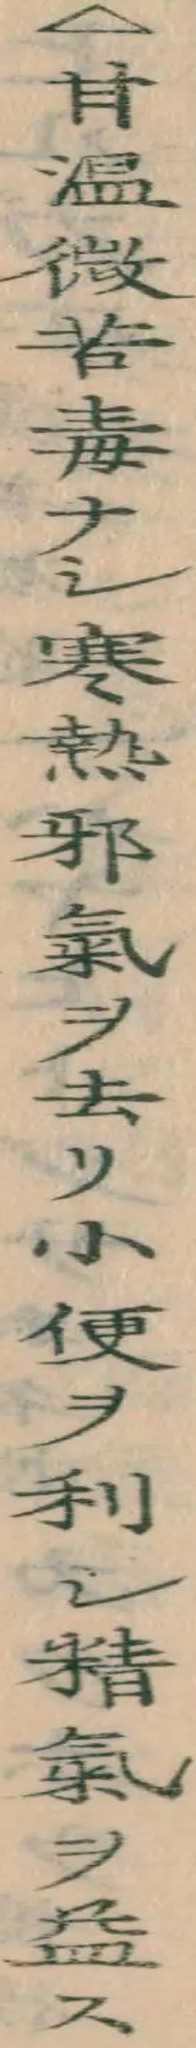△甘温微苦毒ナシ寒熱邪気ヲ去リ小便ヲ利シ精気ヲ益ス
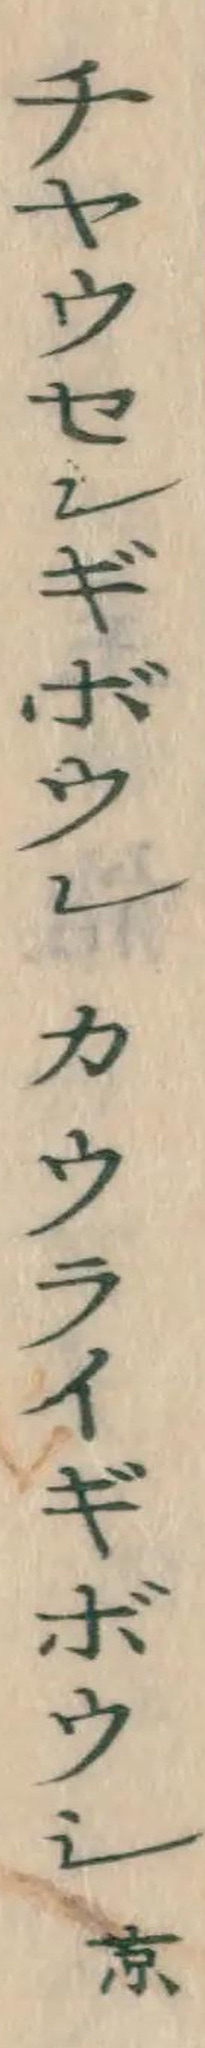チヤウセンギボウシカウライギボウシ京

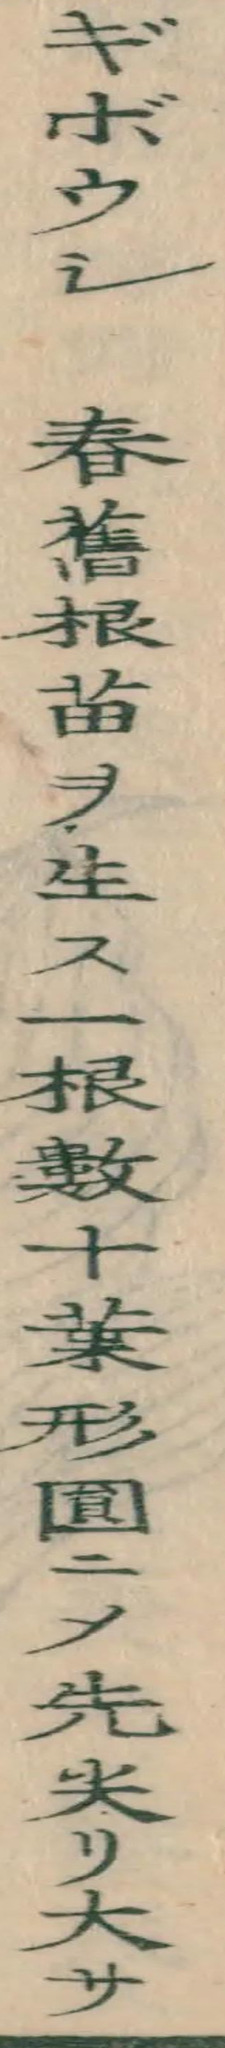ギボウシ春旧根苗ヲ生ス一根数十葉形円ニシテ先尖リ大サ
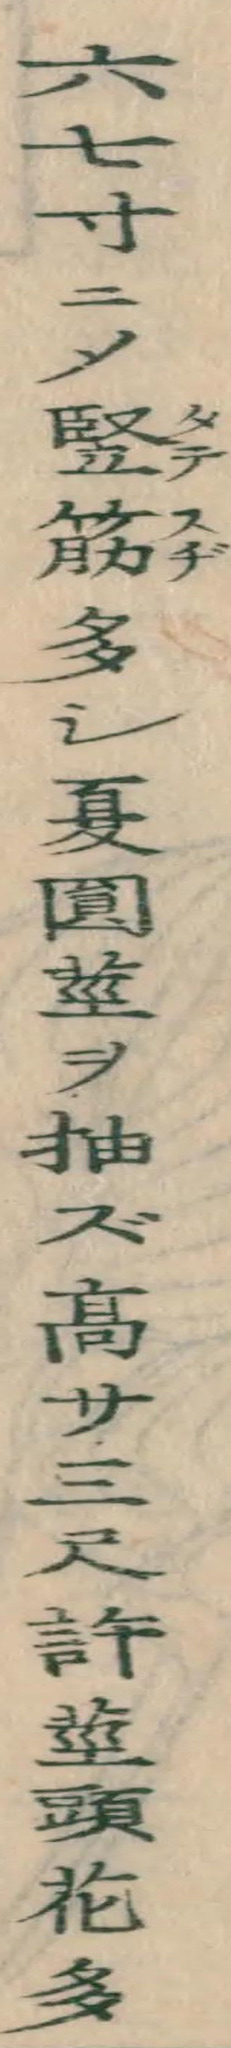六七寸ニシテ竪筋多シ夏円茎ヲ抽ズ高サ三尺許茎頭花多
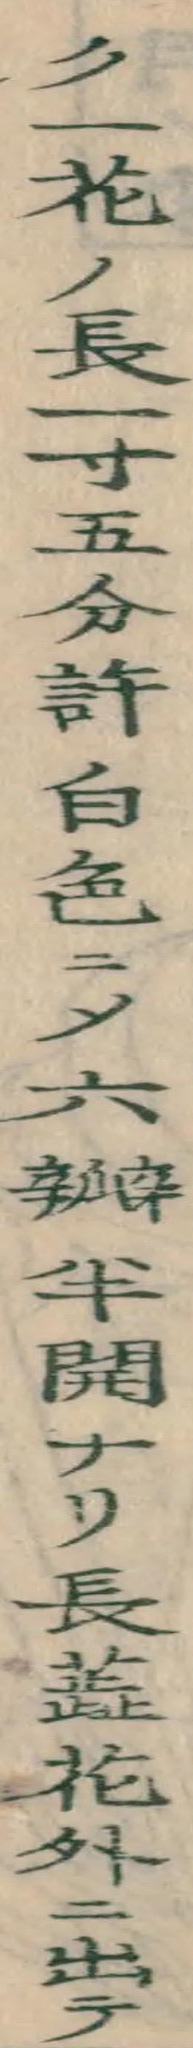ク一花ノ長一寸五分許白色ニシテ六弁半開ナリ長蕊花外ニ出テ
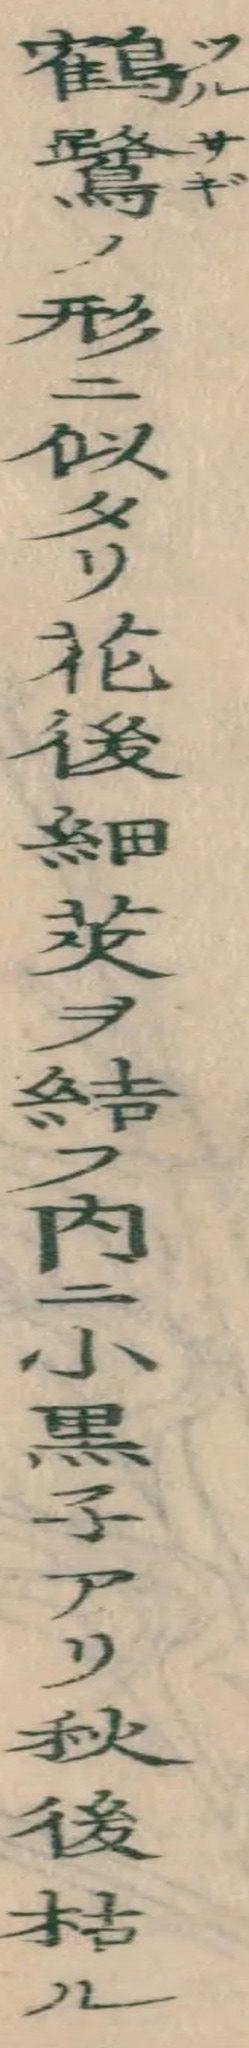鶴鷺ノ形ニ似タリ花後細莢ヲ結フ内ニ小黒子アリ秋後枯ル
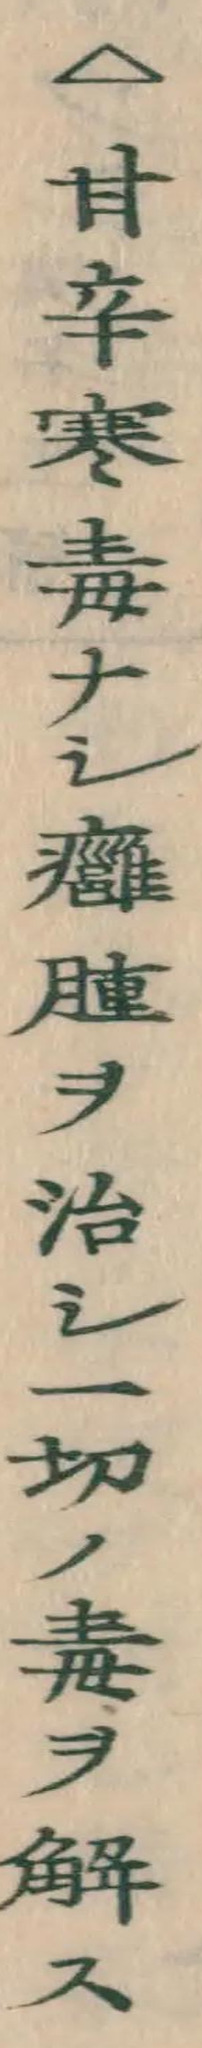△甘辛寒毒ナシ癰腫ヲ治シ一切ノ毒ヲ解ス

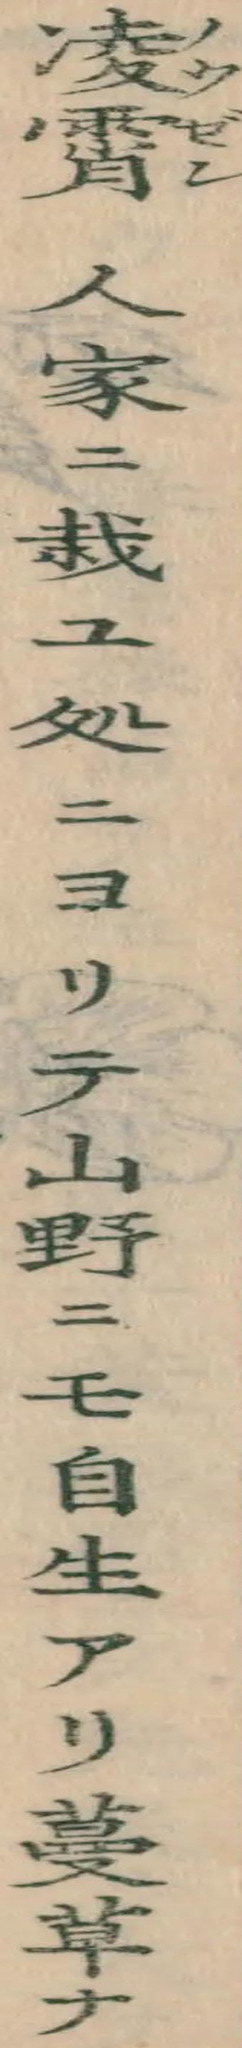凌霄人家ニ栽ユ処ニヨリテ山野ニモ自生アリ蔓草ナ
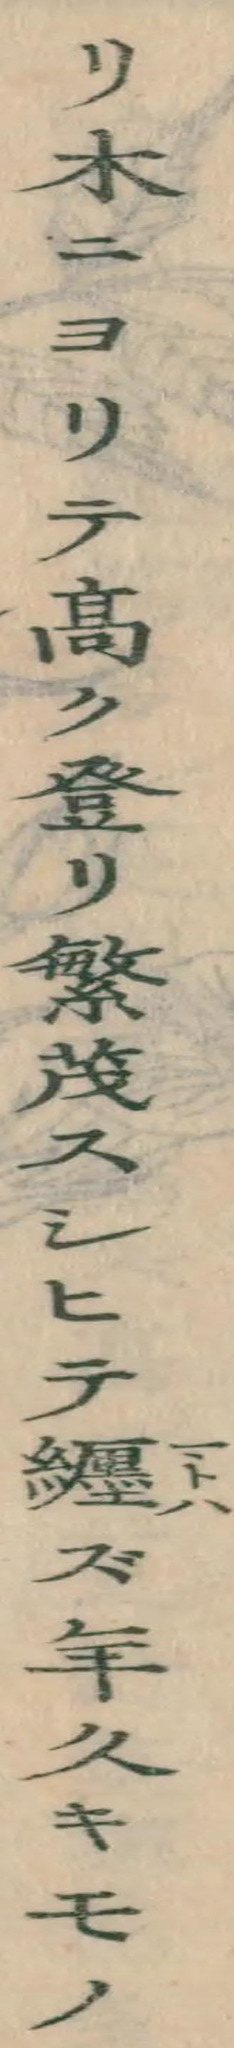リ木ニヨリテ高ク登リ繁茂スシヒテ纏ズ年久キモノ
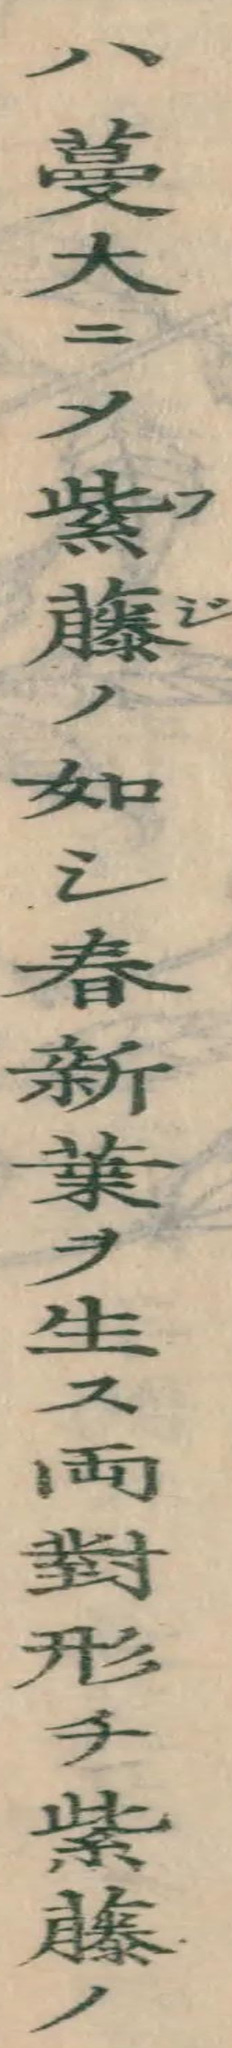ハ蔓大ニシテ紫藤ノ如シ春新葉ヲ生ス両対形チ紫藤ノ
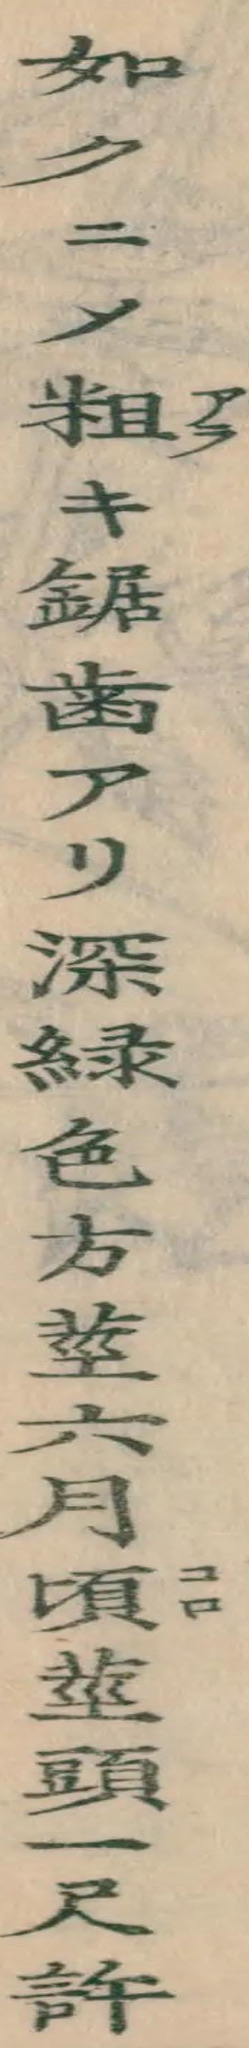如クニシテ粗キ鋸歯アリ深緑色方茎六月頃茎頭一尺許
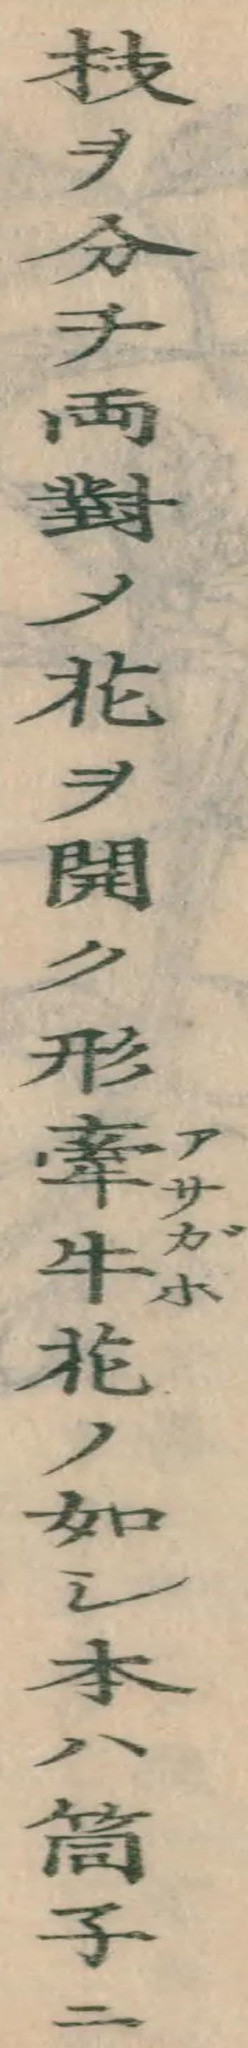枝ヲ分チ両対シテ花ヲ開ク形牽牛花ノ如シ本ハ筒子ニ
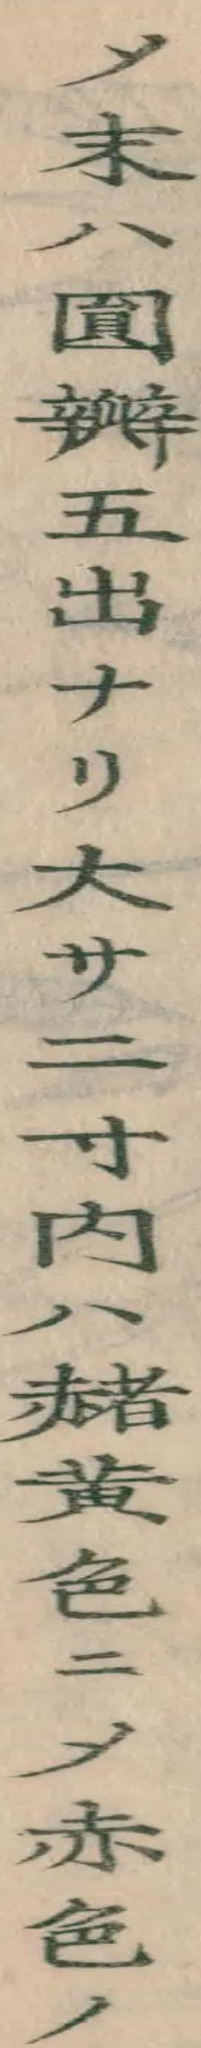シテ末ハ円弁五出ナリ大サ二寸内ハ赭黄色ニシテ赤色ノ
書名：これこれ草 2巻. [2]
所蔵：国立国会図書館 National Diet Library, JAPAN
